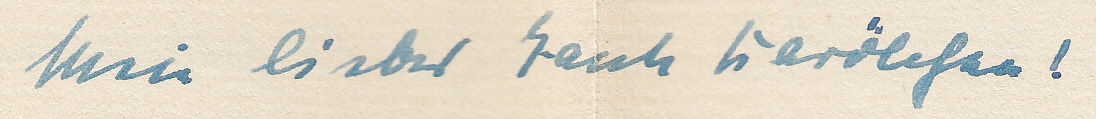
Mein liebes Tant Carölchen!
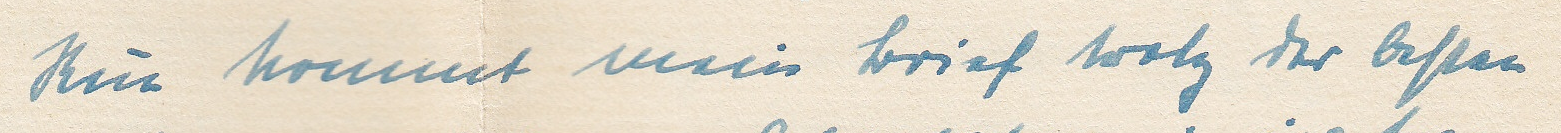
Hier kommt mein Brief trotz der Oster
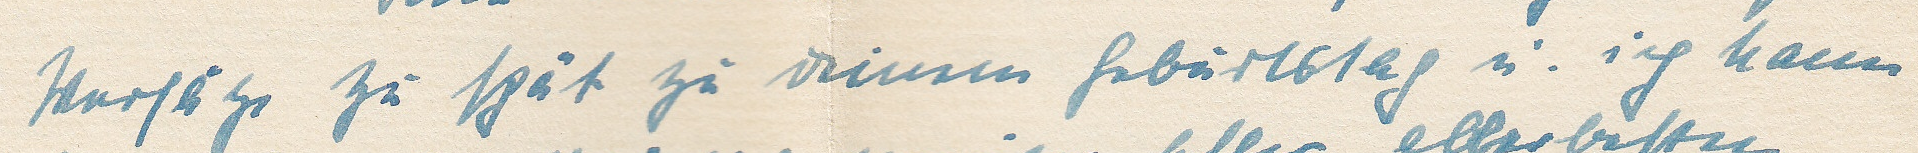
Hetze zu spät zu deinem Geburtstag u. ich kann
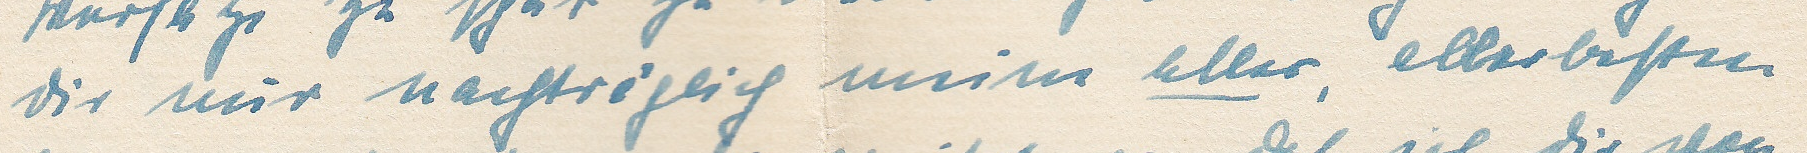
dir nur nachträglich weiter aller, allerbesten
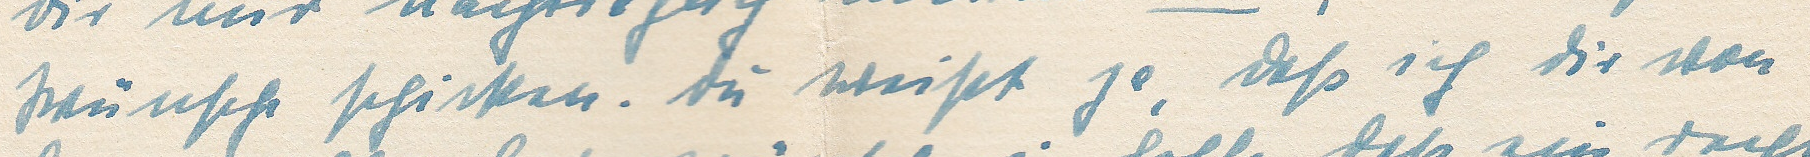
Wünsche schicken. Du weißt ja, daß ich dir von
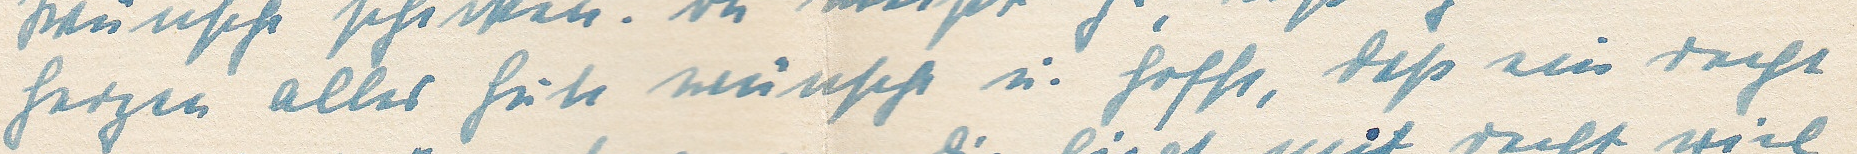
Herzen alles Gute wünsche u. hoffe, das ein recht
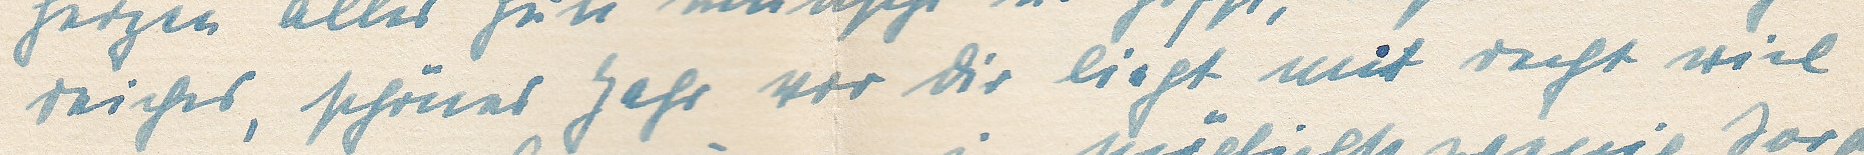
reiches, schönes Jahr vor dir liegt mit recht viel
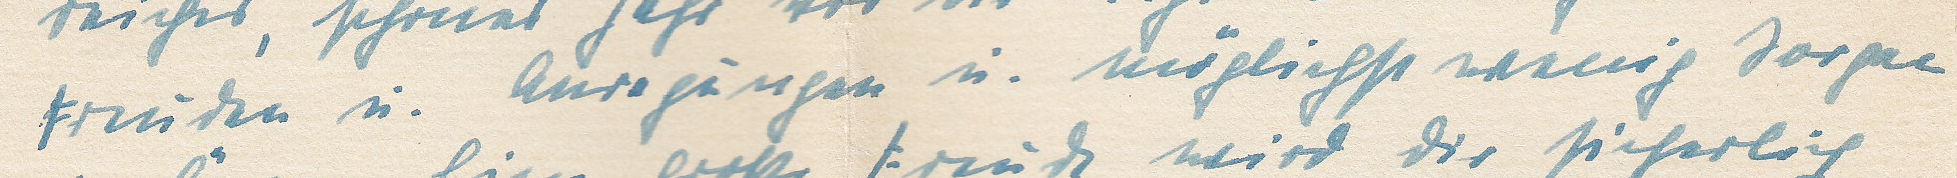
Freude u. Anregungen u. möglichst wenig Sorgen
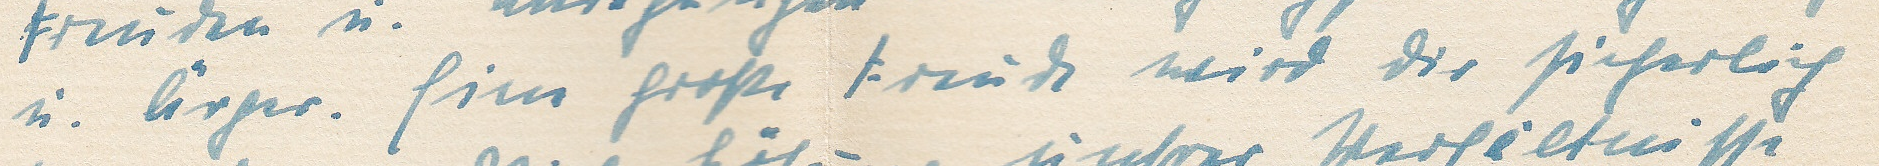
u. Ärger. Eine große Freude wird Dir sicherlich
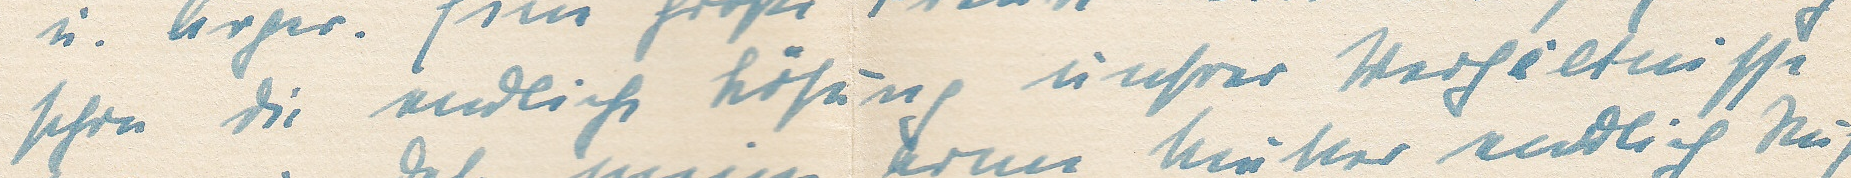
schon die endliche Lösung unserer Verhältnisse
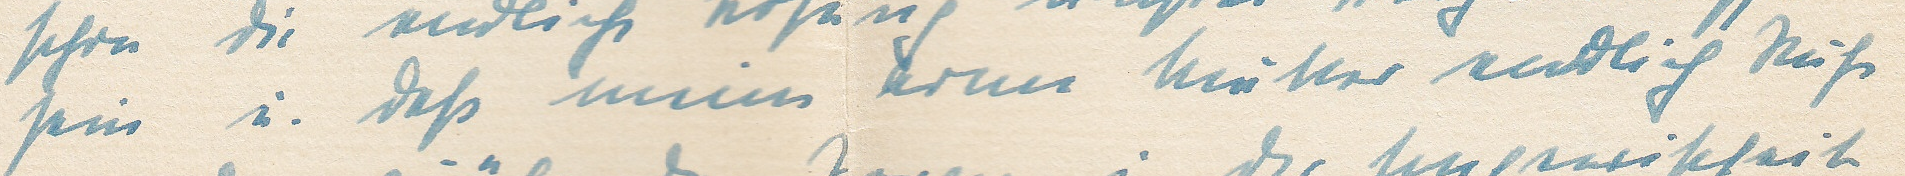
sein u. daß meine arme Mutter endlich Ruhe
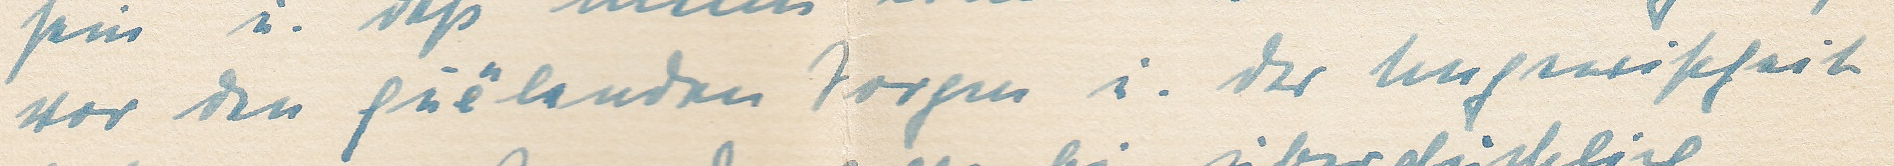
vor den quälenden Sorgen u. der Ungewißheit
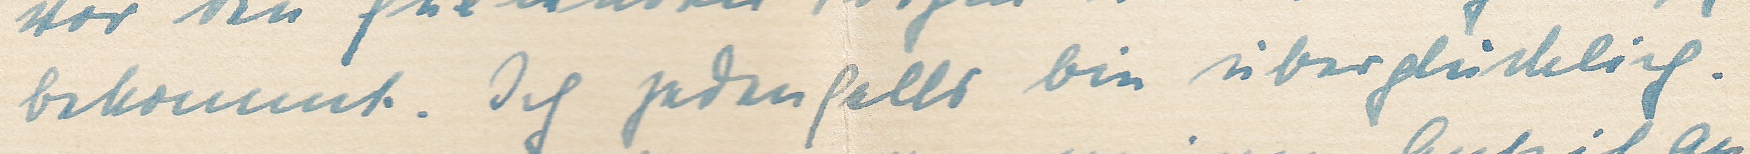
bekommt. Ich jedenfalls bin überglücklich.
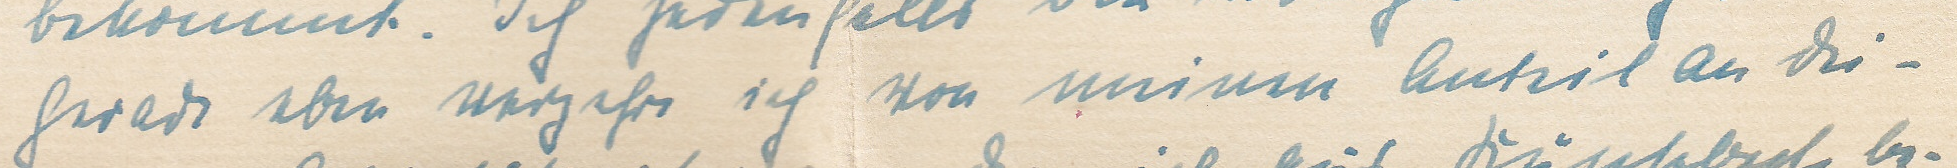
Grad eben verzehre ich von meinem Anteil an dei¬
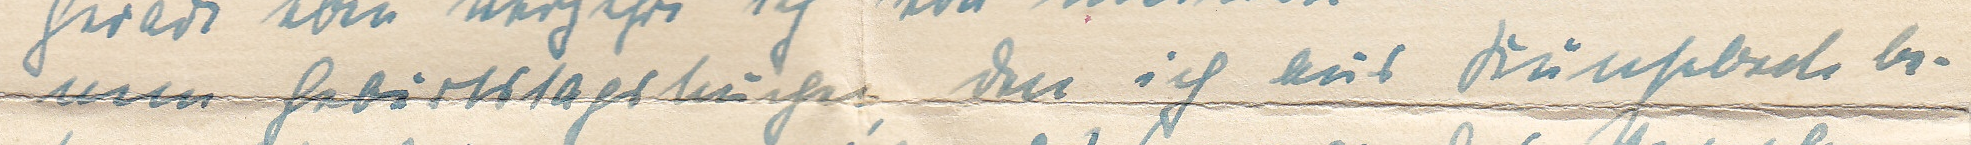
nem Geburtstagskuchen den ich aus Künsebeck be¬
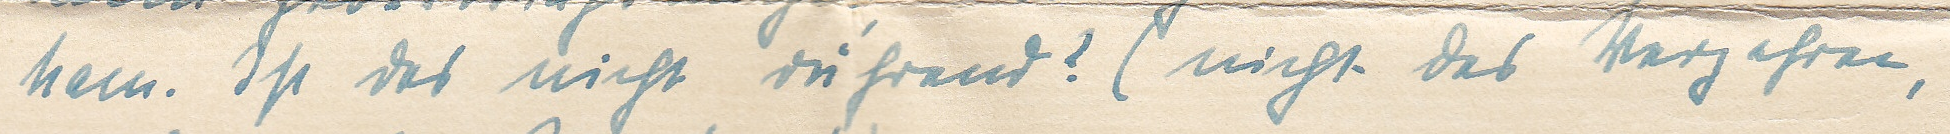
kam. Ist das nicht rührend? (nicht das Marzipan,
